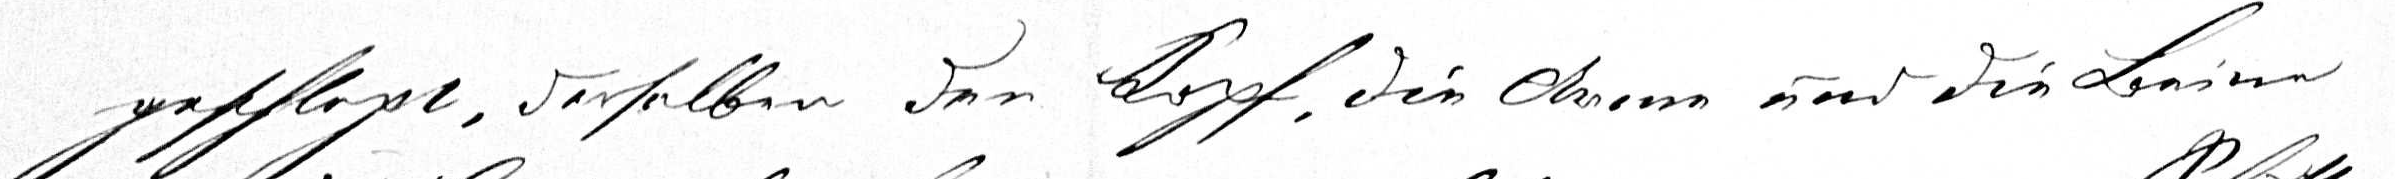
geschlept, derselben den Kopf, die Arme und die Beine
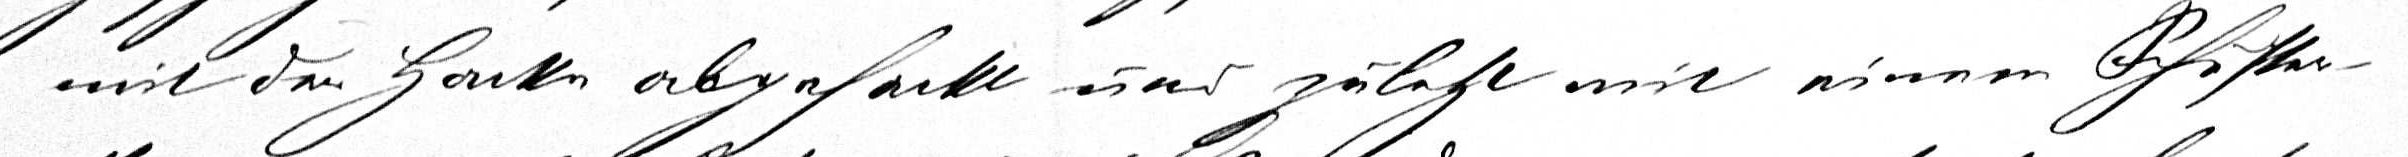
mit der Hacke abgehackt und zuletzt mit einem Schuster¬
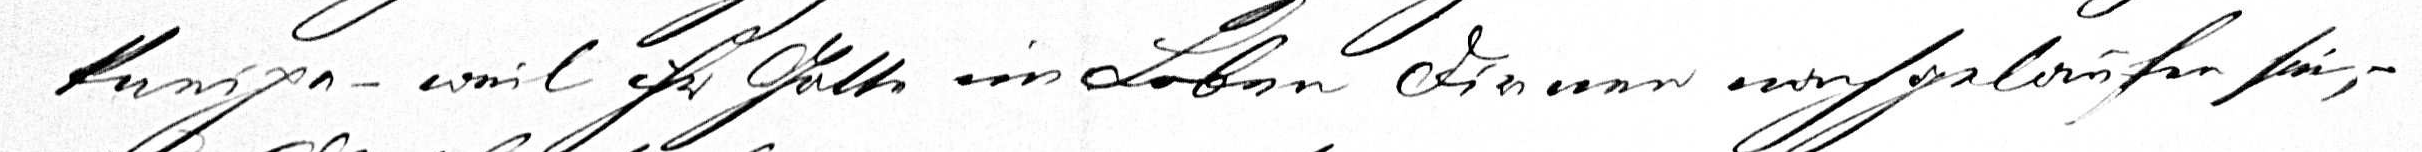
kneipe – weil ihr Gatte im Leben Dirnen nachgelaufen sei,
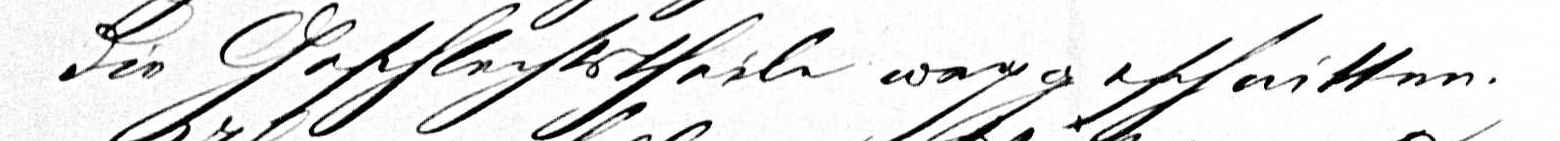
die Geschlechtstheile weggeschnitten.
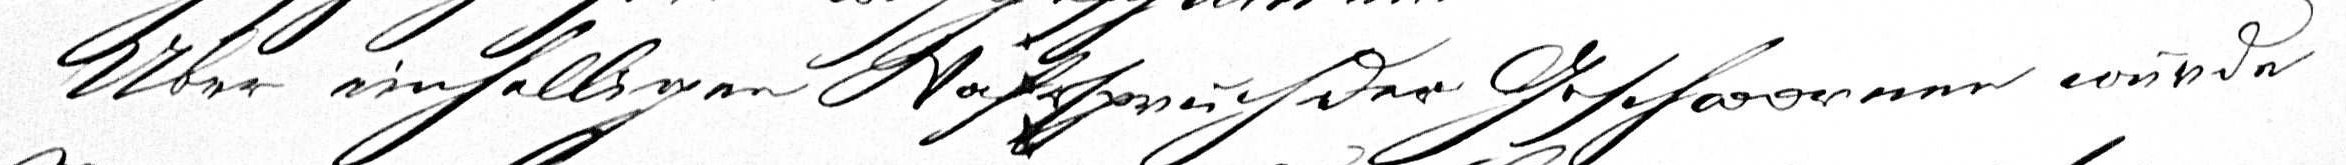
Uber einhelligen Wahrspruch der Geschorenen wurde
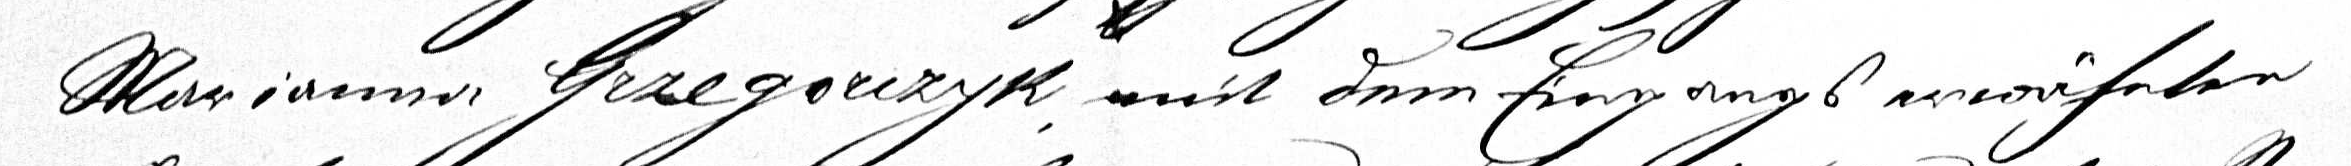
Marianne Grzegorczyk mit dem Eingangs erwähnten
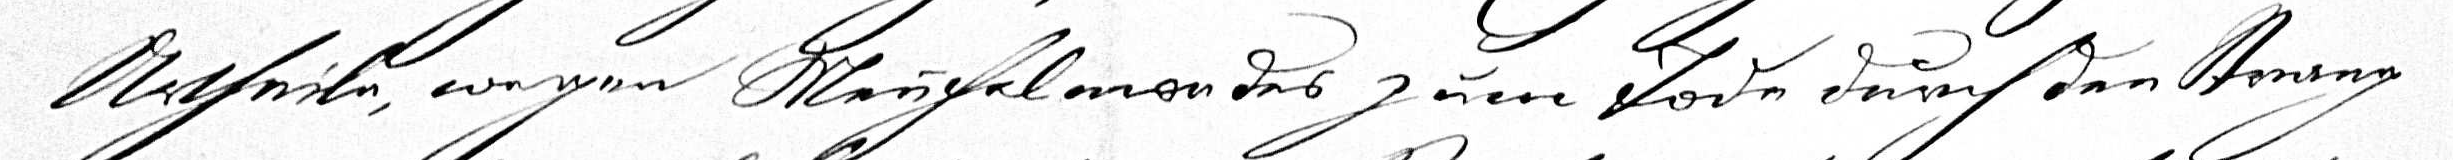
Urtheile, wegen Meuchelmordes zum Tode durch den Strang
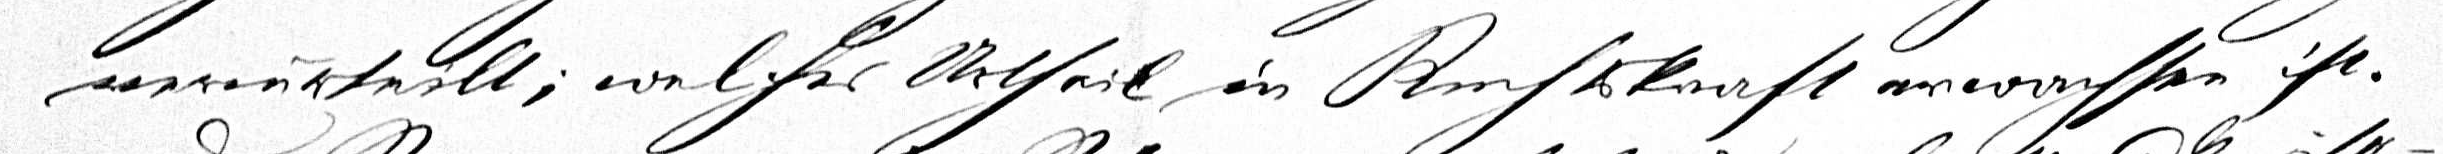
verurtheilt; welcher Urtheil in Rechtskraft erwachsen ist.
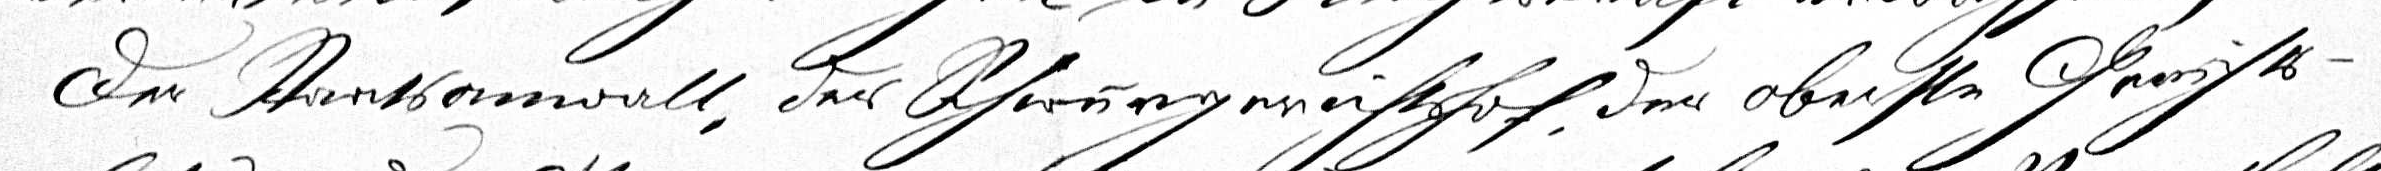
Der Staatsanwalt, der Schwurgerichtshof, der oberste Gerichts¬
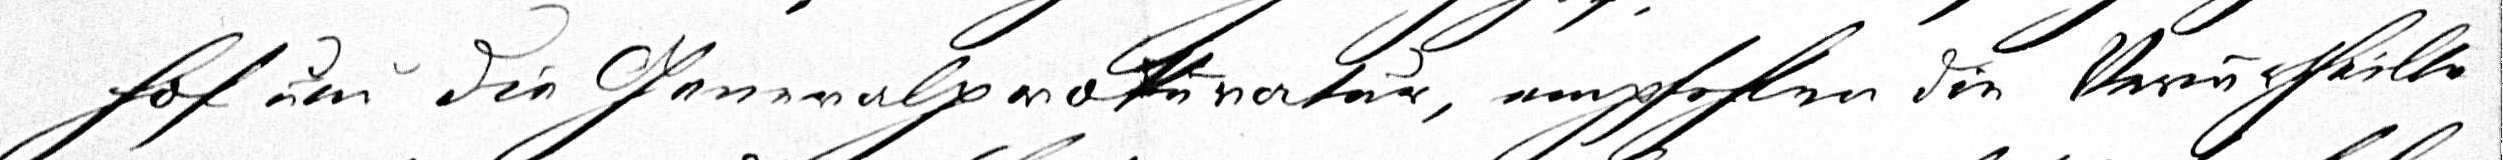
hof um die Generalprokuratur, empfehlen die Verurtheilte
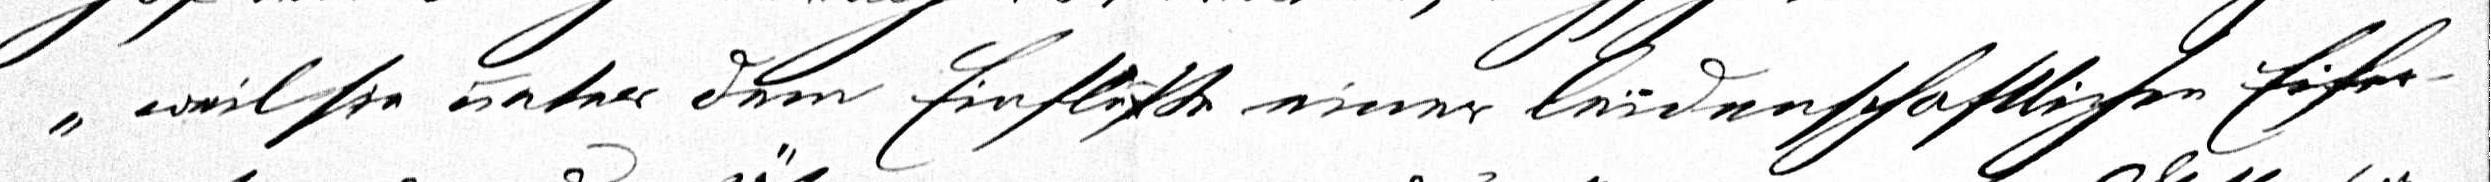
„weil sie unter dem Einfluß einer leidenschaftlichen Eifer¬
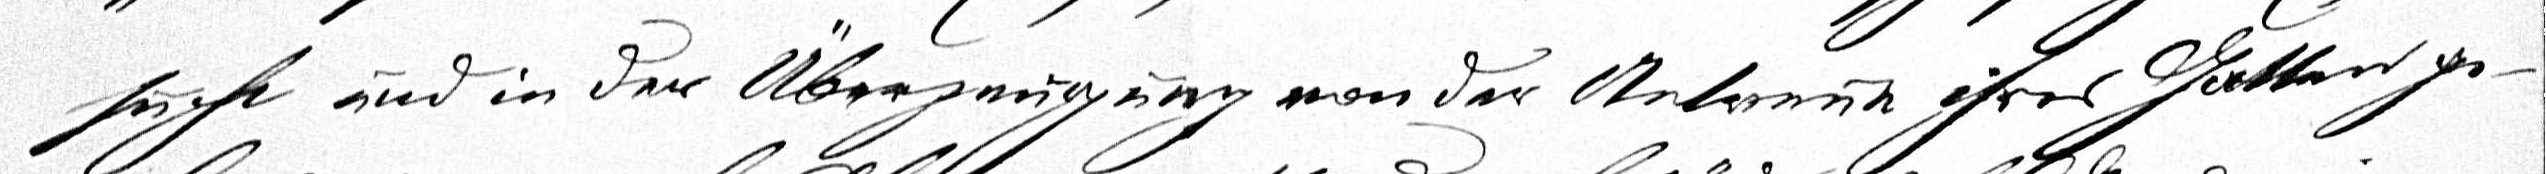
sucht und in der Überzeugung von der Untreue ihrer Gatten ge¬
